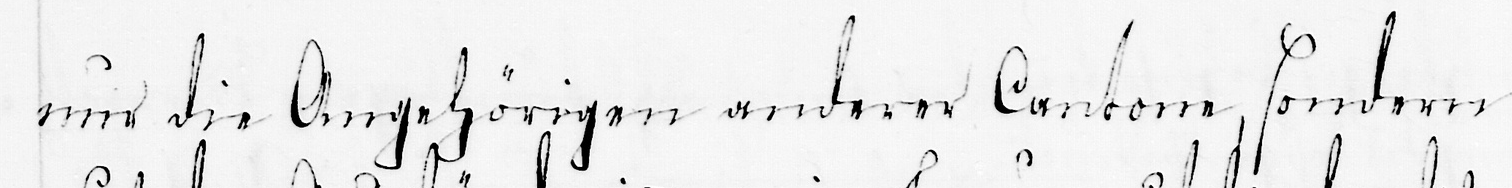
nur die Angehörigen anderer Cantone, sondern
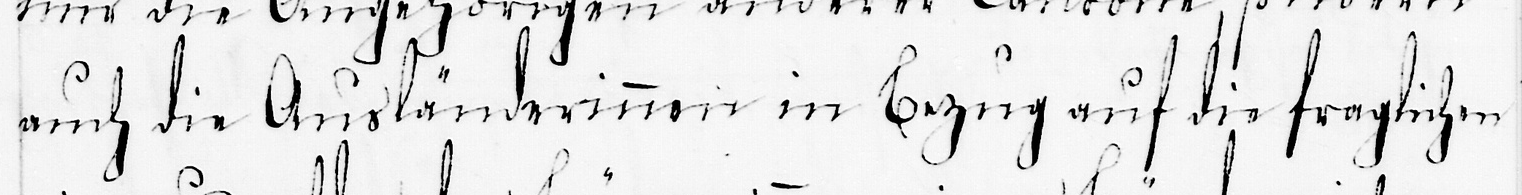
auch die Ausländerinnen in Bezug auf die fraglichen
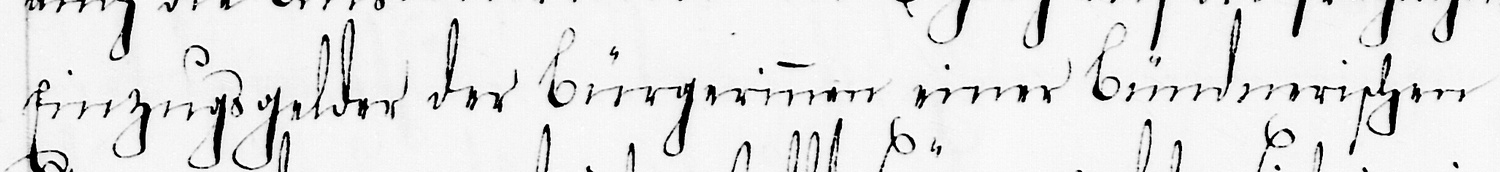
Einzugsgelder der Bürgerinnen einer Bündnerischen
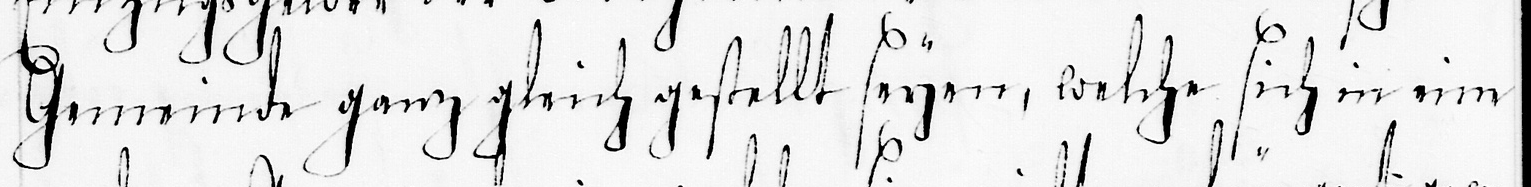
Gemeinde ganz gleich gestellt seyen, welche sich in eine
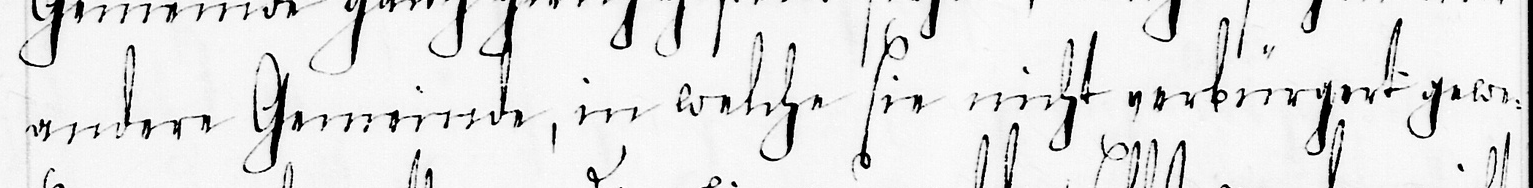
andere Gemeinde, in welche sie nicht verbürgert gewe¬
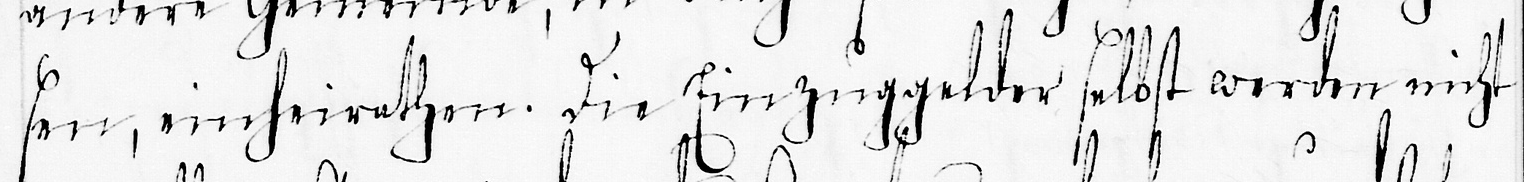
sen, einheirathen. Die Einzuggelder selbst werden nicht
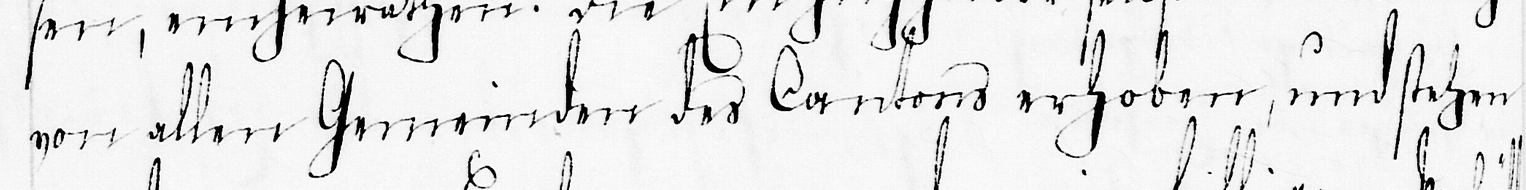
von allen Gemeinden des Cantons erhoben, und stehen
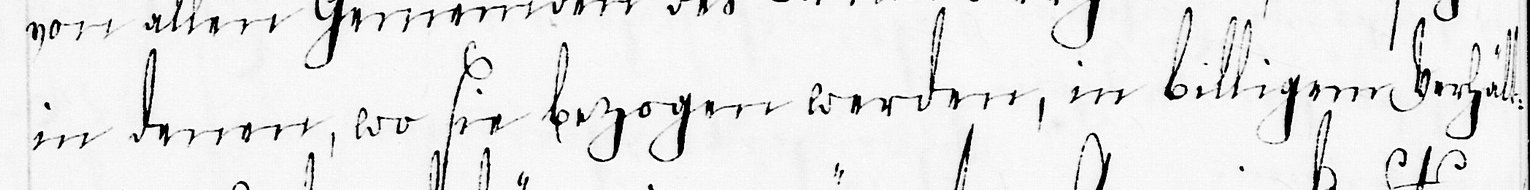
in denen, wo sie bezogen werden, in billigem Verhäl¬
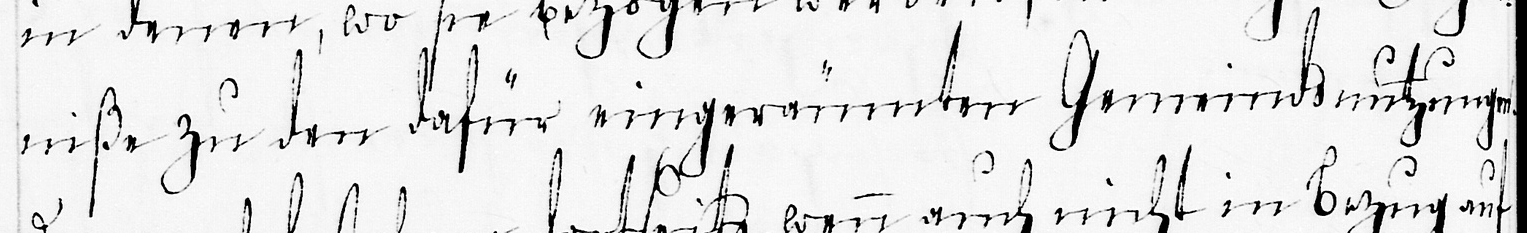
tniße zu den dafür eingeräumten Gemeindsnutzunge¬
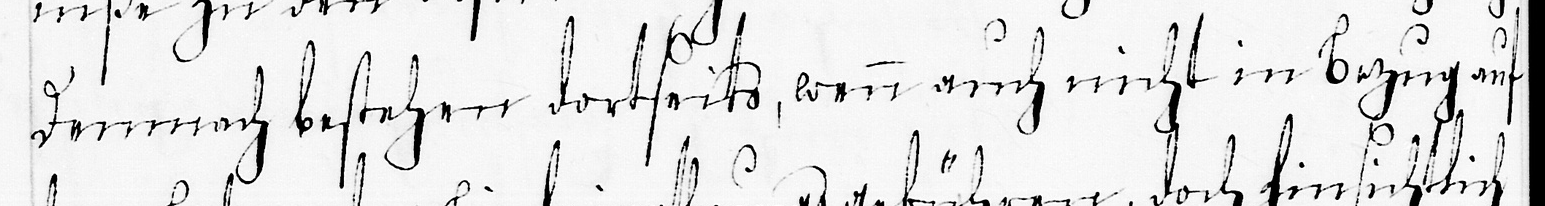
Demnach bestehen dortseits, wenn auch nicht in Bezug auf
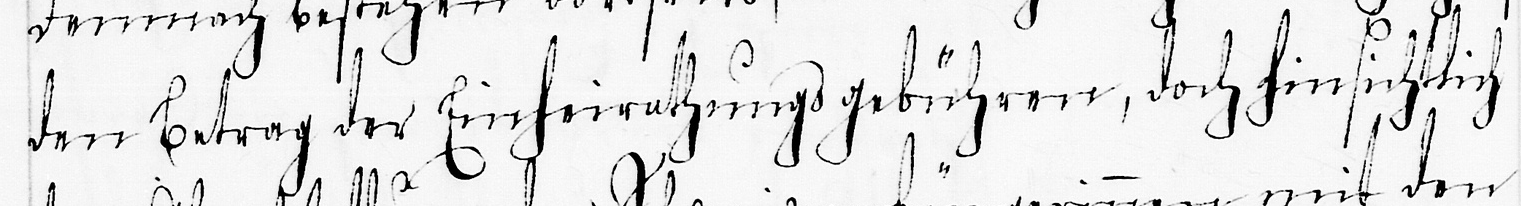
den Betrag der Einheirathungsgebühren, doch hinsichtlich
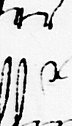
n.
